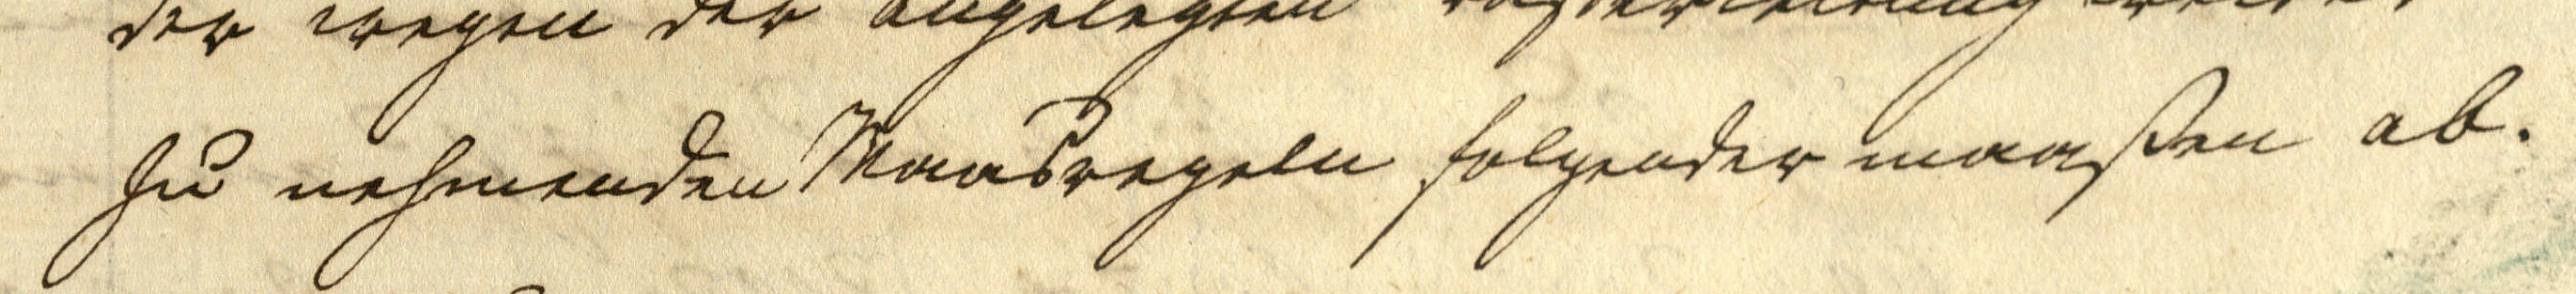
zu nehmenden Maasregeln folgendermaaßen ab-
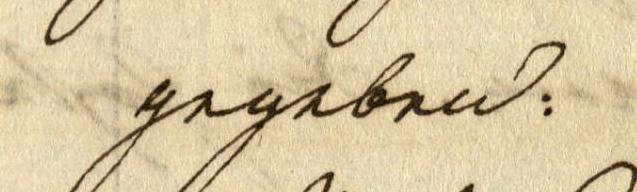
gegeben:
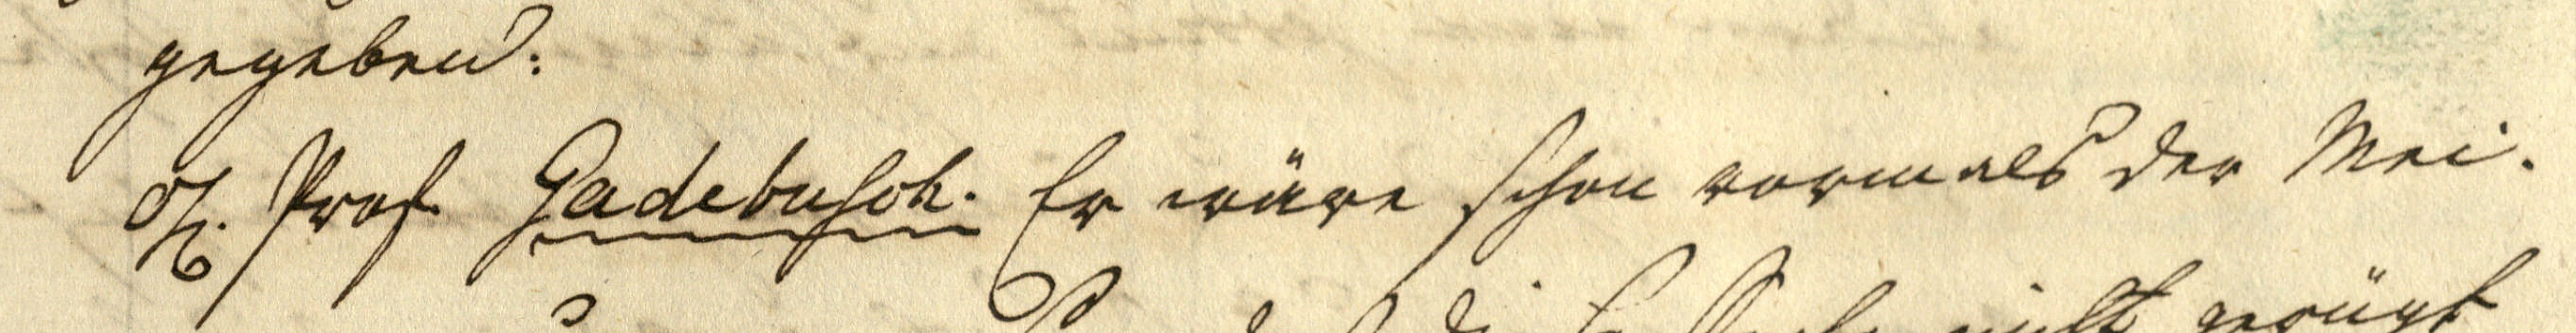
dh. Prof. Gadebusch. Er wäre schon vormals der Mei-
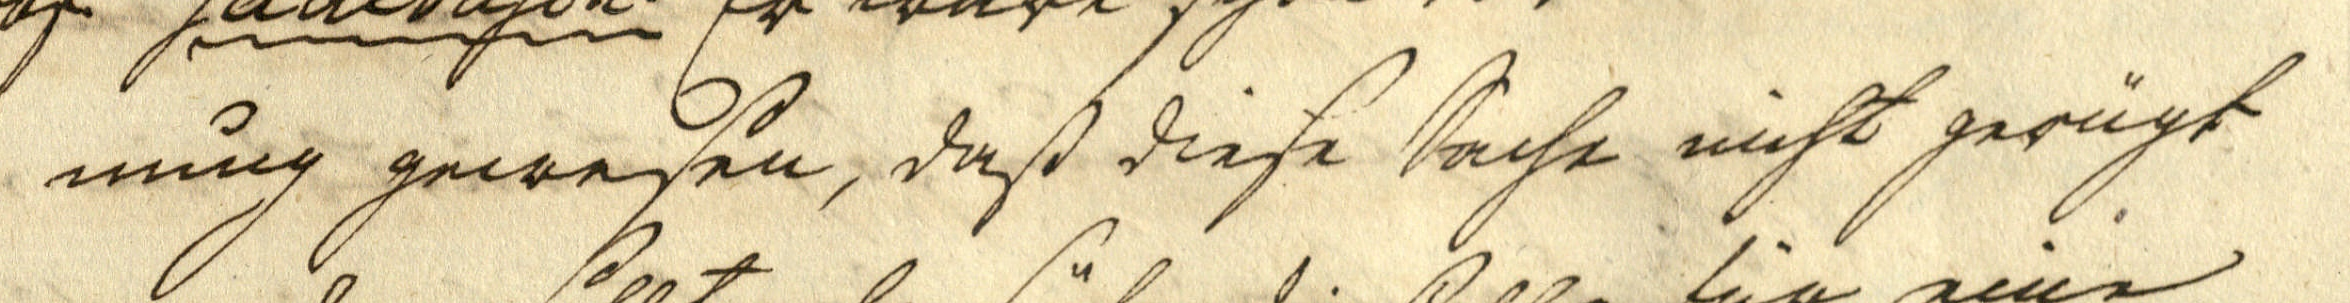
nung gewesen, daß diese Sache nicht gerügt
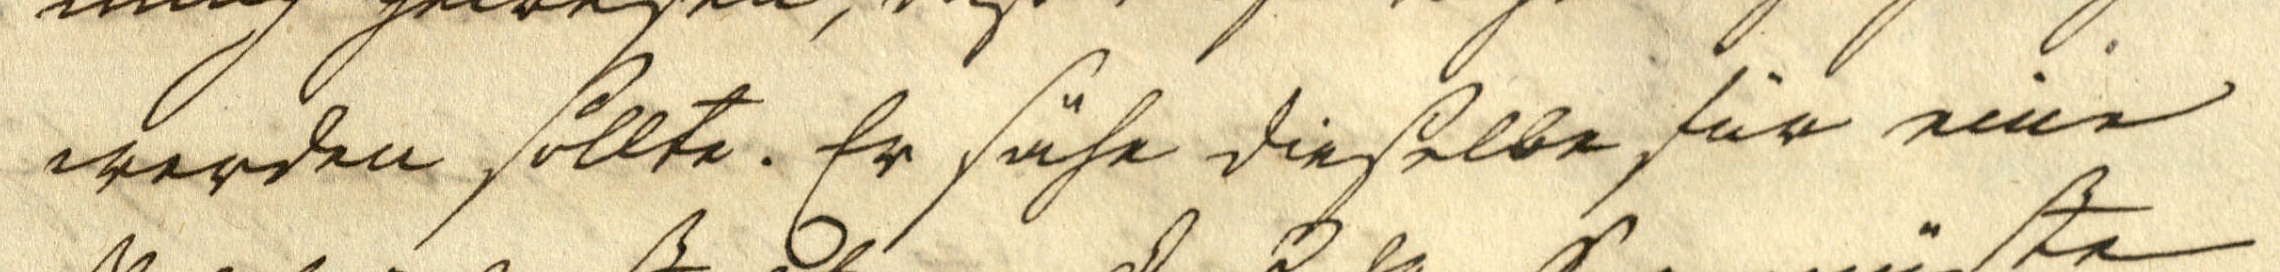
werden sollte. Er sähe dieselbe für eine
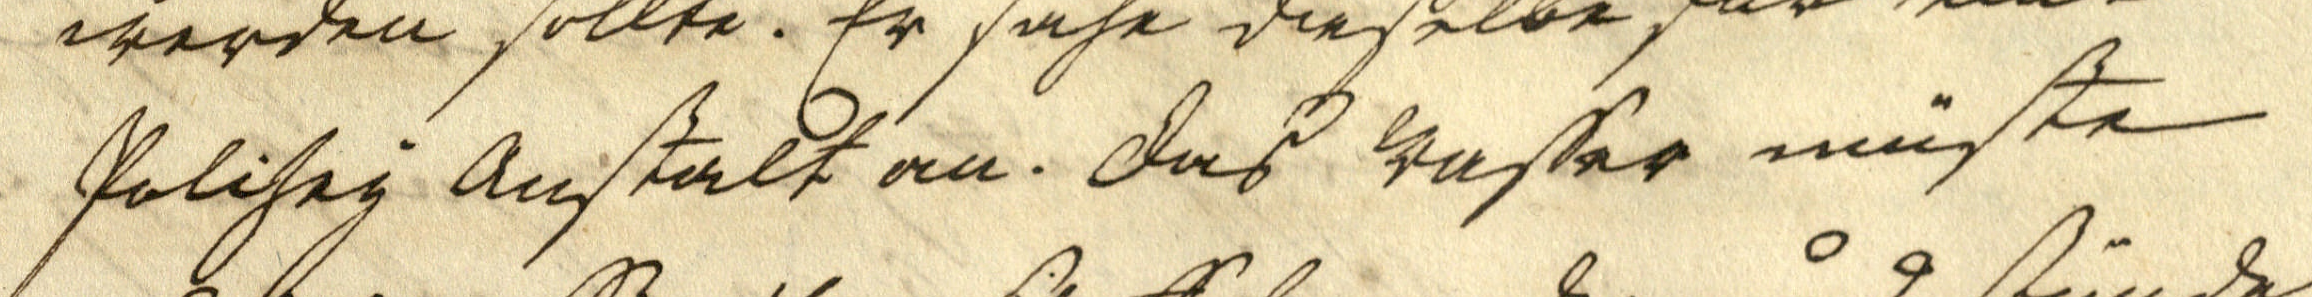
Polizey Anstalt an. Das Wasser müßte
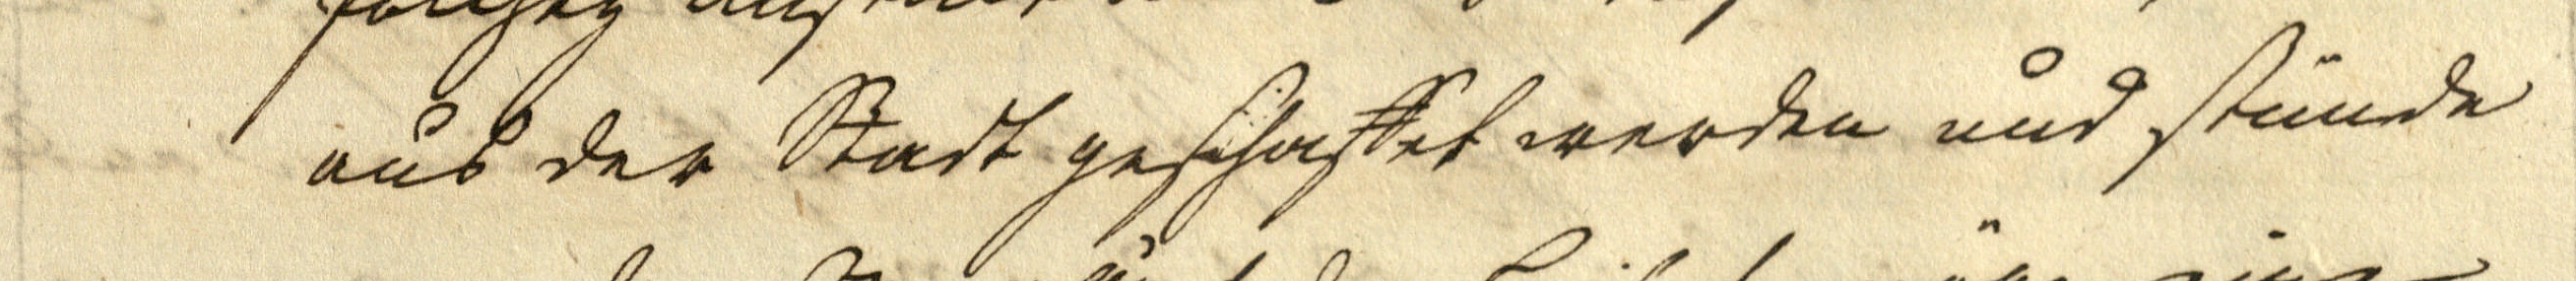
aus der Stadt geschaffet werden und stünde
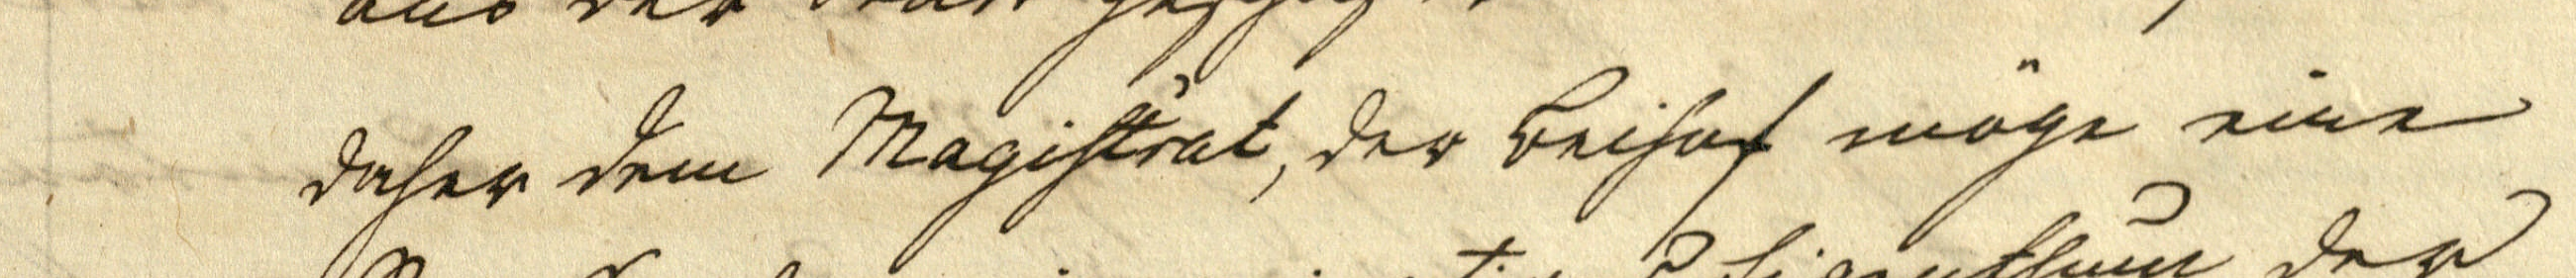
daher dem Magistrat, der Beihof möge eine
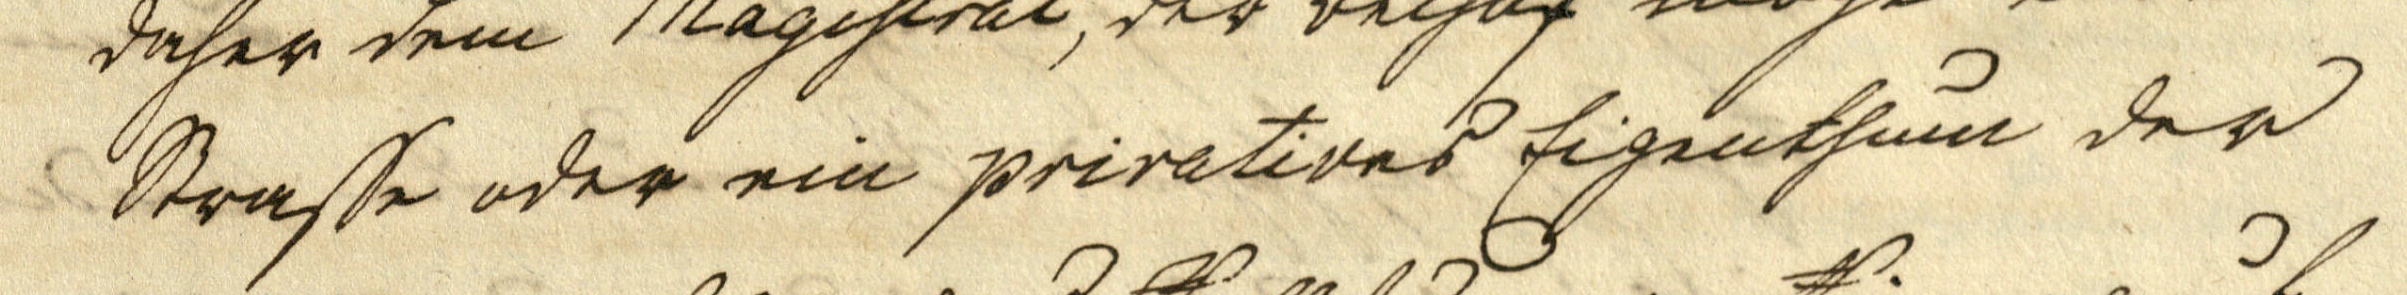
Strasse oder ein privatives Eigenthum der
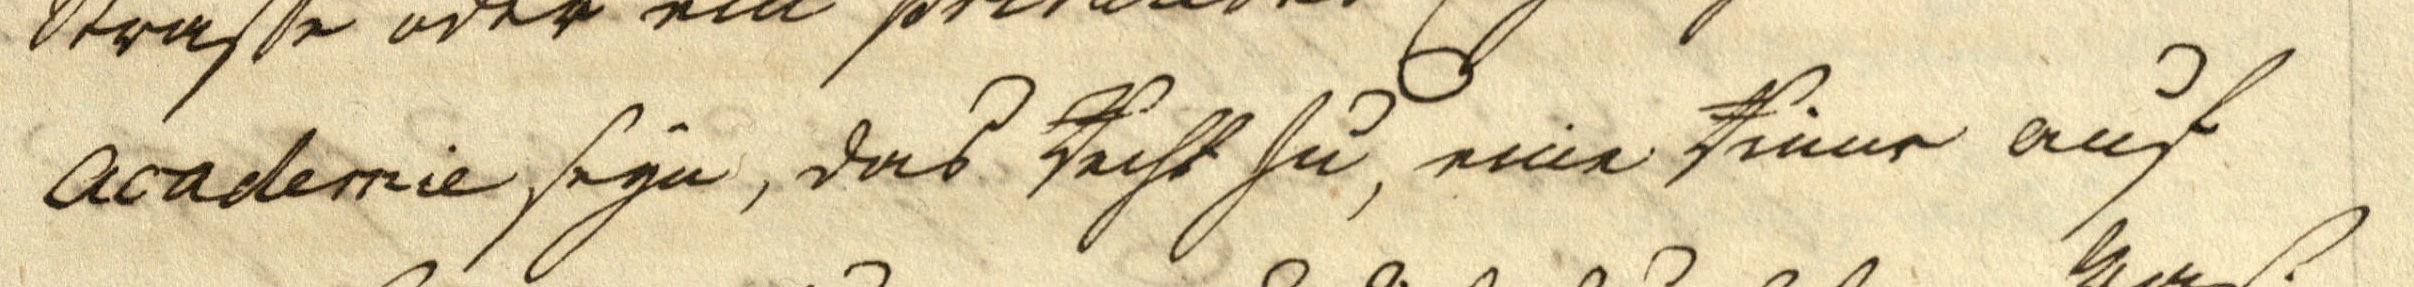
Academie seyn, das Recht zu, eine Rinne auf
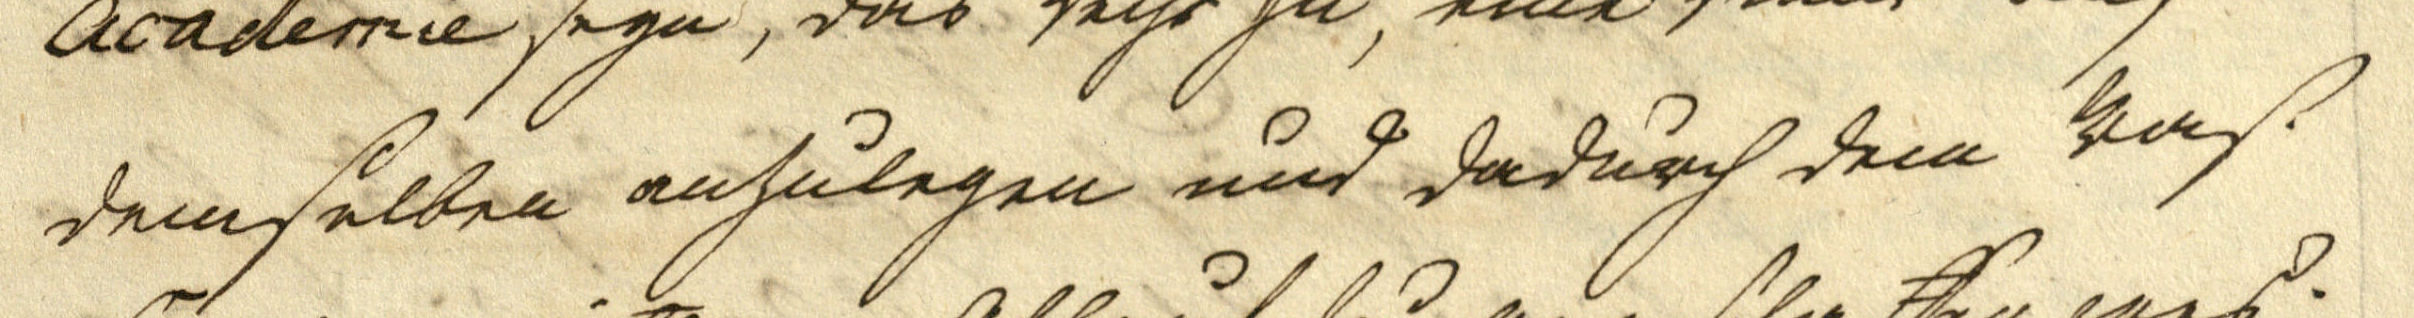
demselben anzulegen und dadurch dem Was-
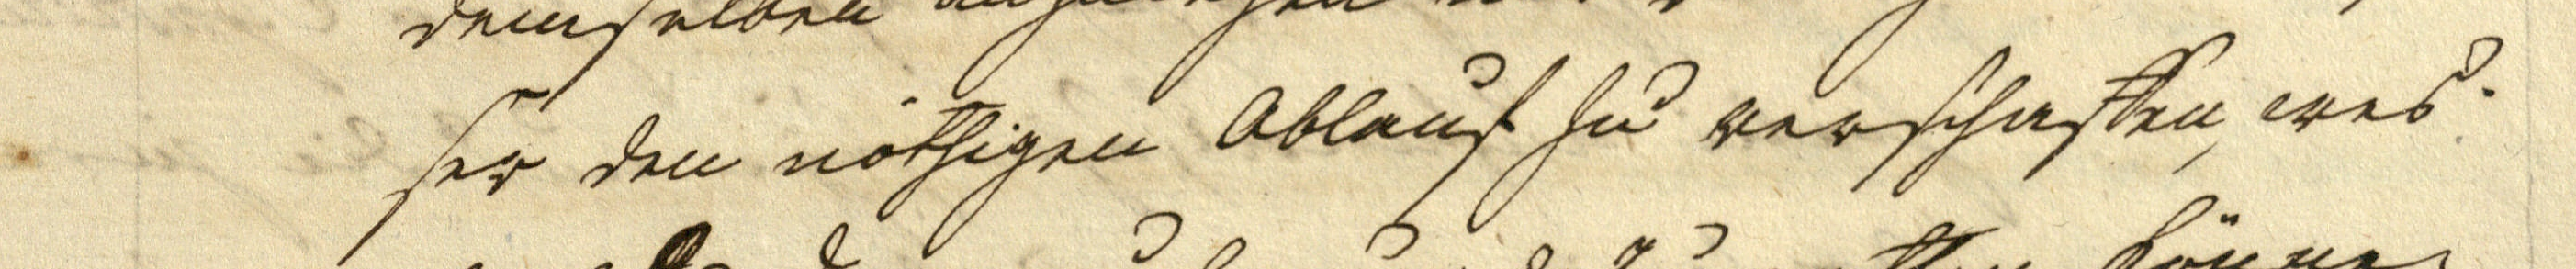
ser den nöthigen Ablauf zu verschaffen, wes-
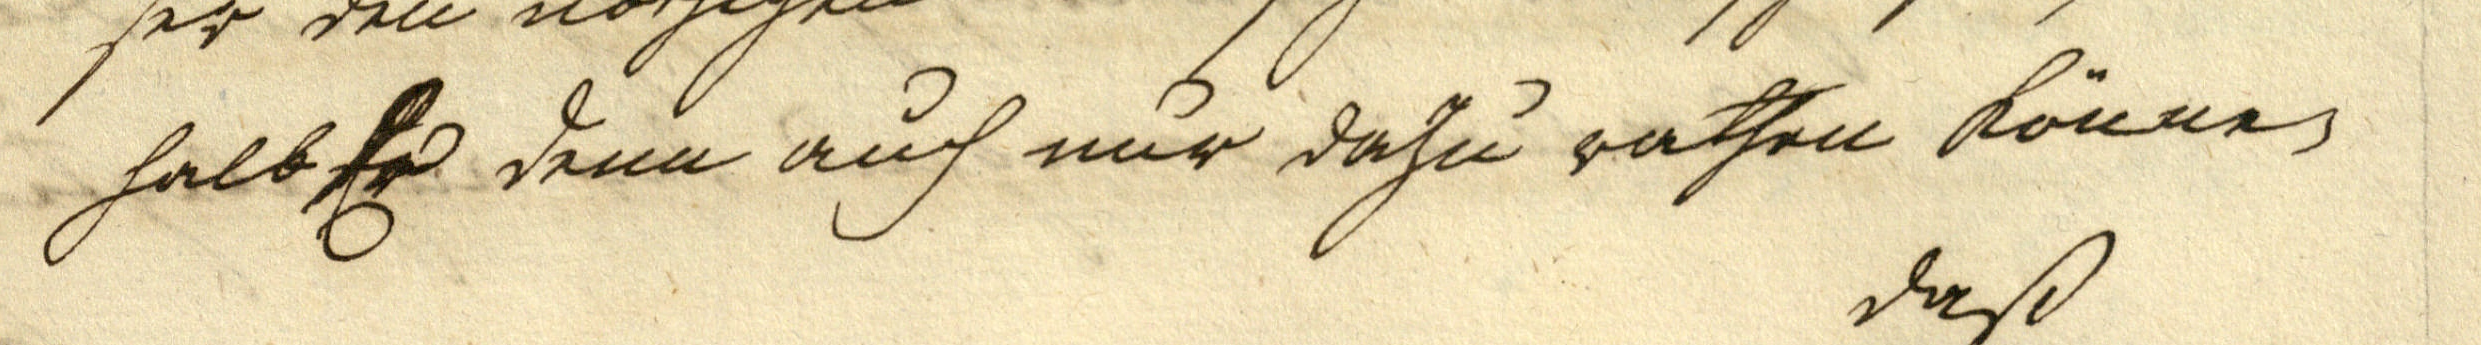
halb Er denn auch nur dazu rathen könne,
